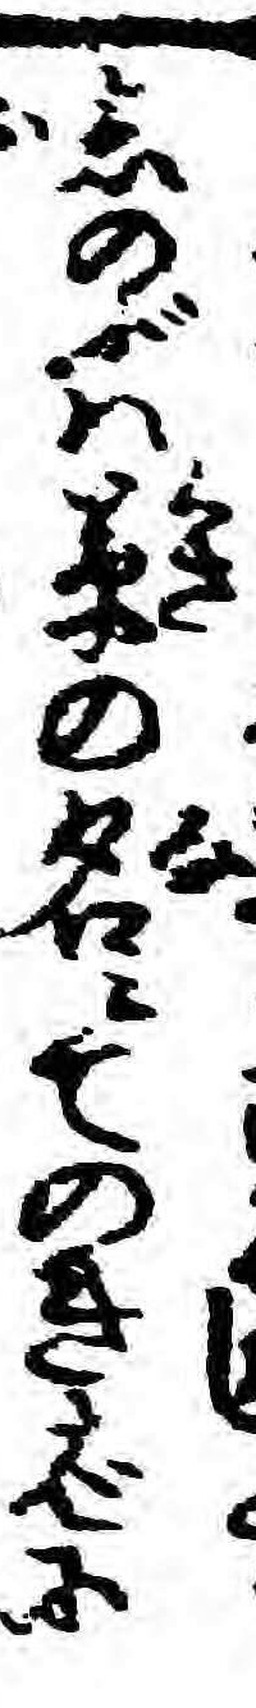しのぶは草の名にてのきばに
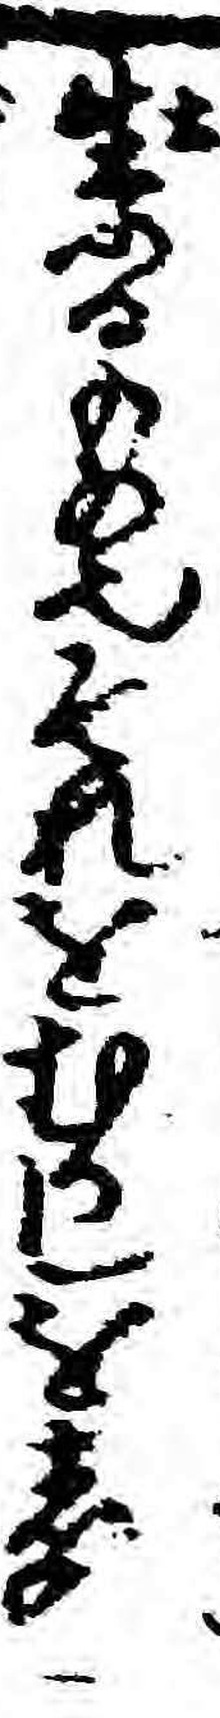生ふるもの也それをむかしをしの
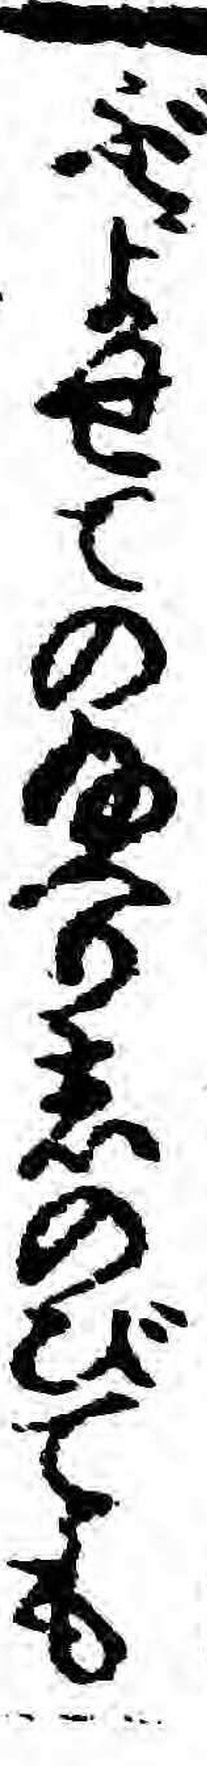ぶによせての給ヘりしのびても
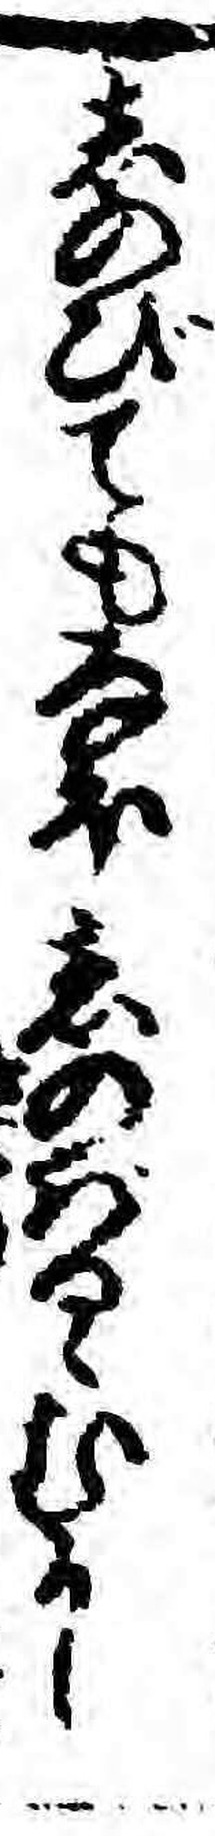しのびてもなほしのばるゝむかし
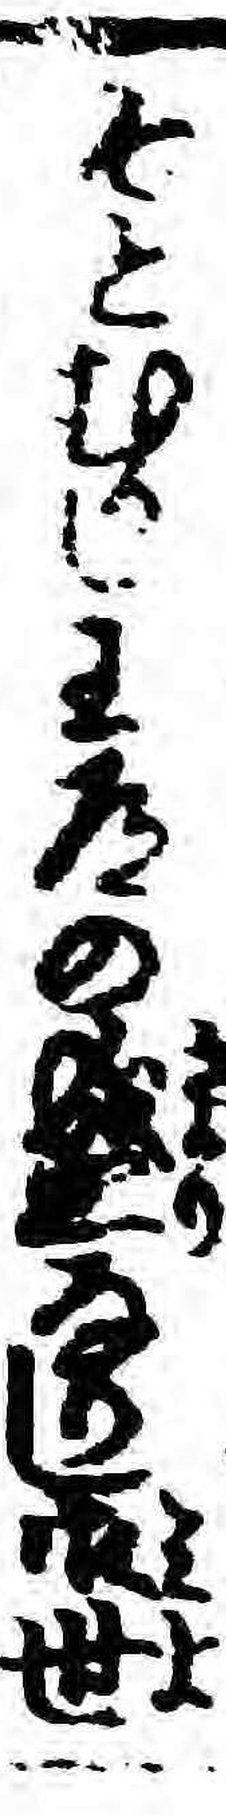そとむかし王道の盛なりし御世
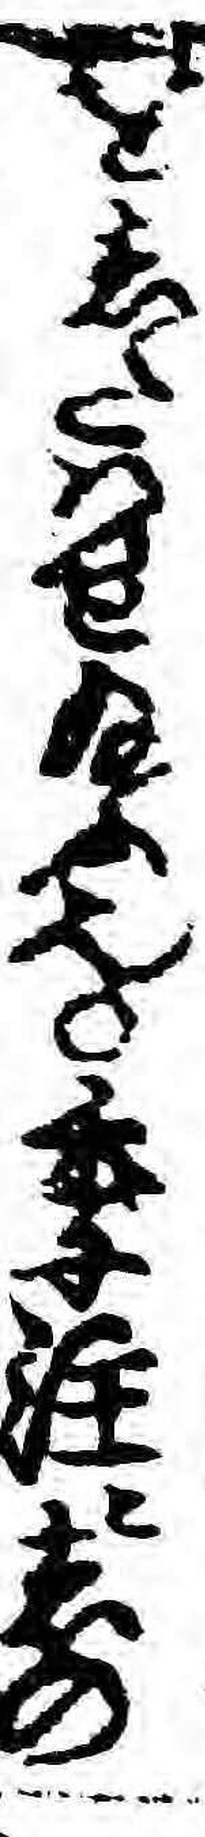をしたはせ給ふ也◯季注にしの
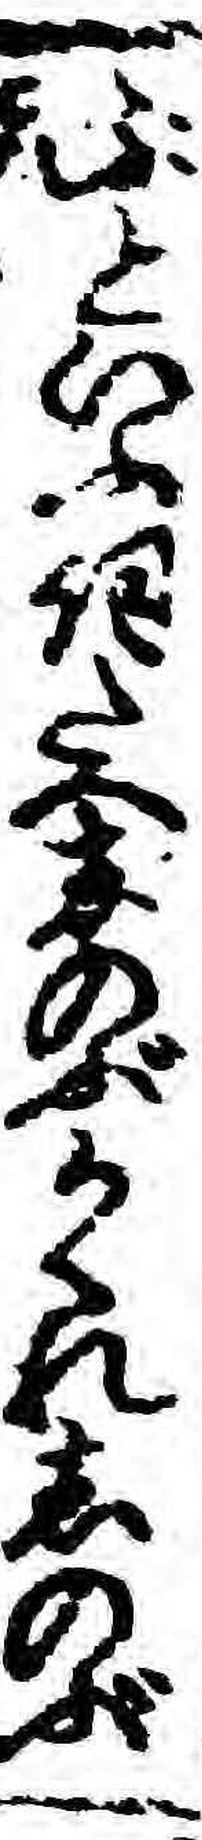ぶといふ詞たへしのぶかくれしのぶ
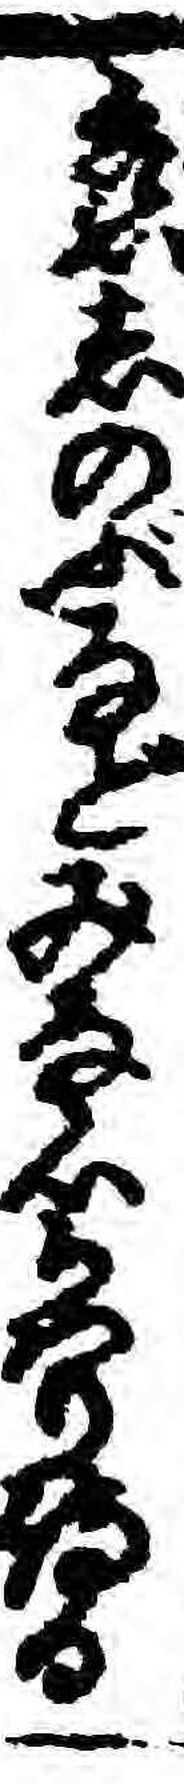恋しのぶなどみな心かはり侍る
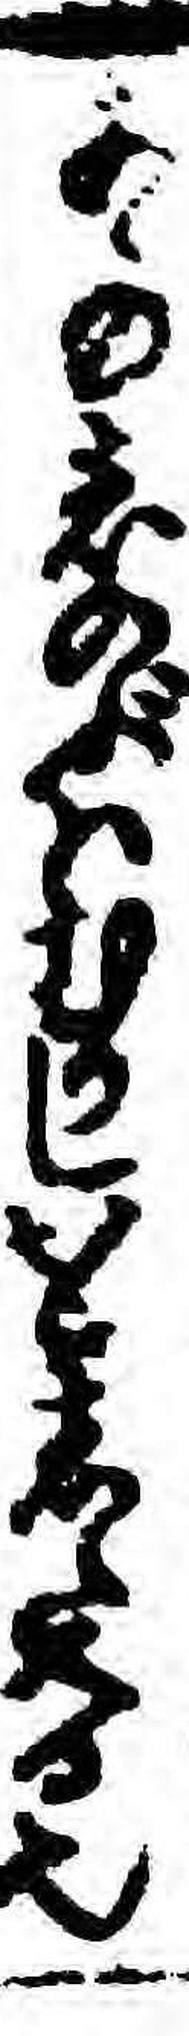こゝのしのぶはむかしをしたへる也
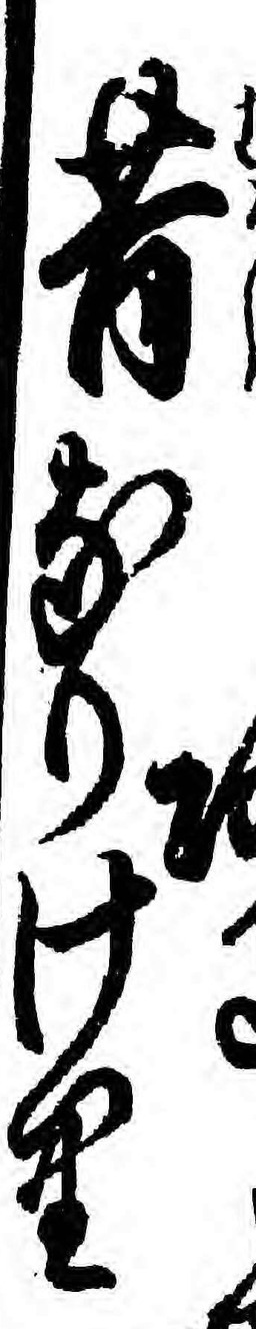昔なりけり
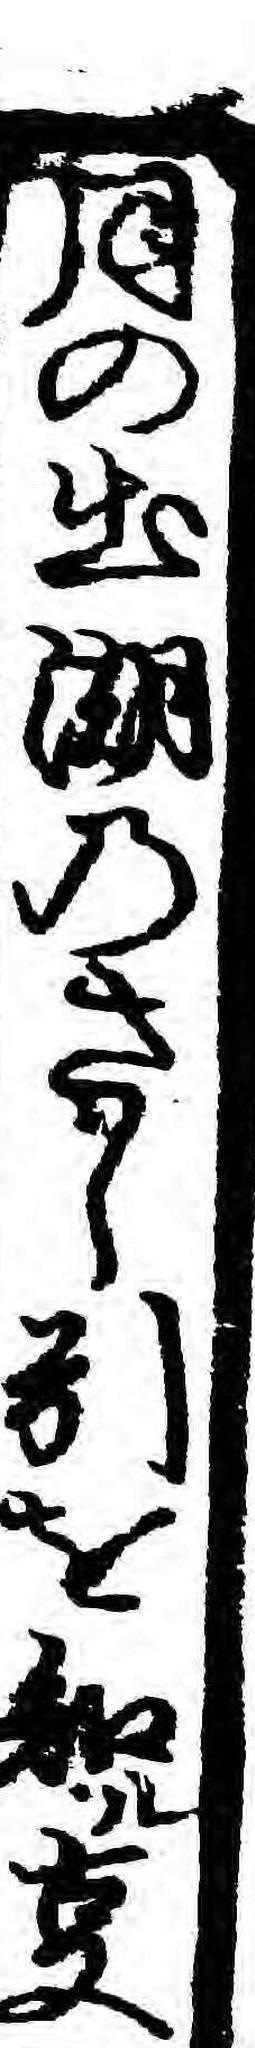月の出潮のさし引きを知る事
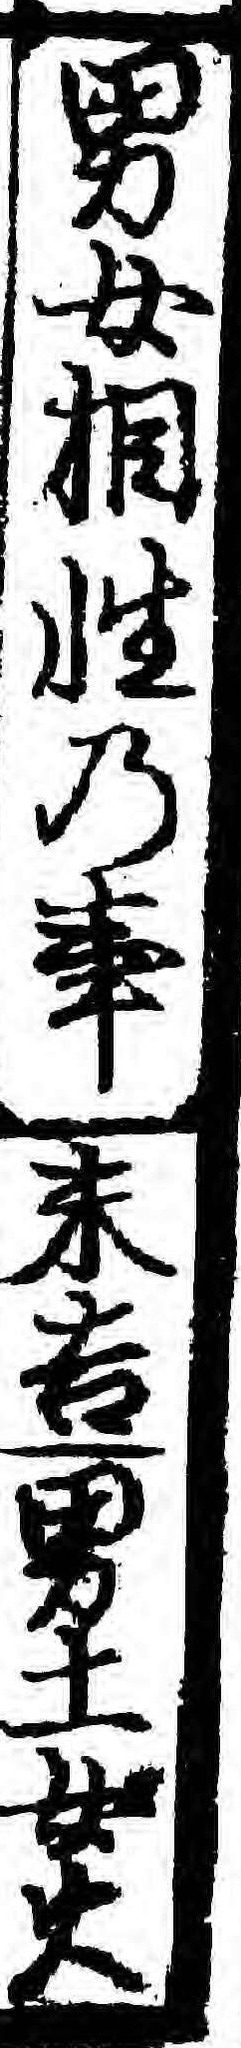男女相性の事末吉男土女火
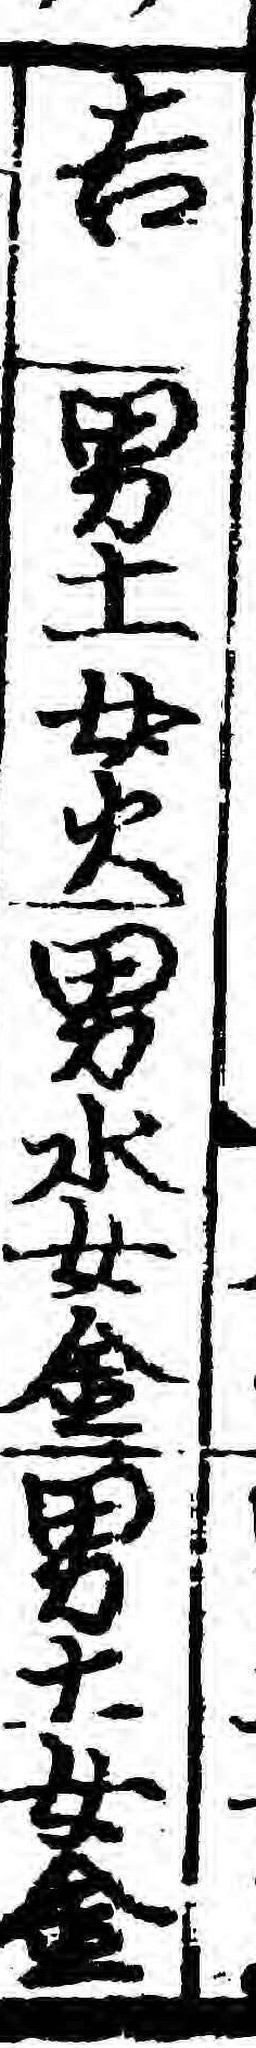吉男土女火男水女金男土女金
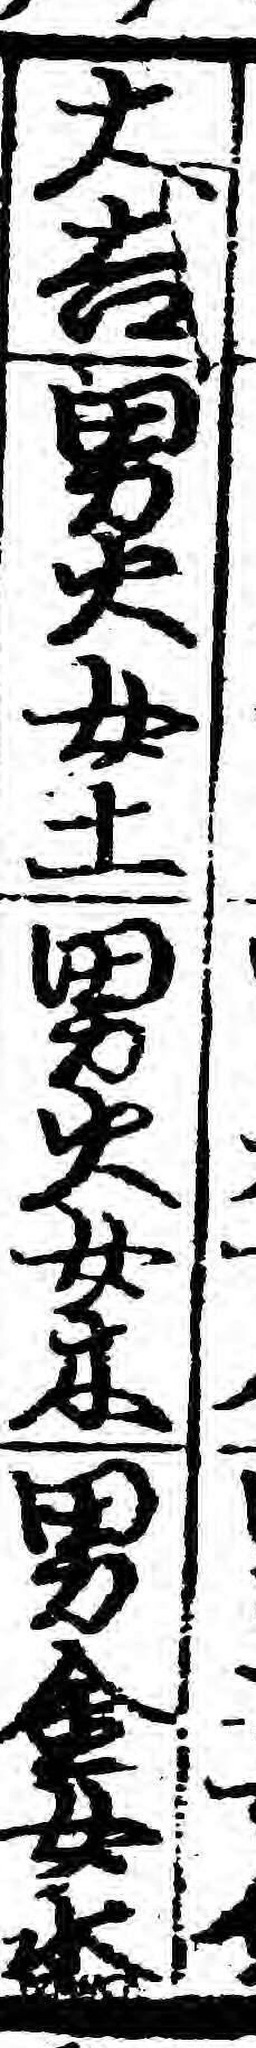大吉男火女土男火女木男金女水
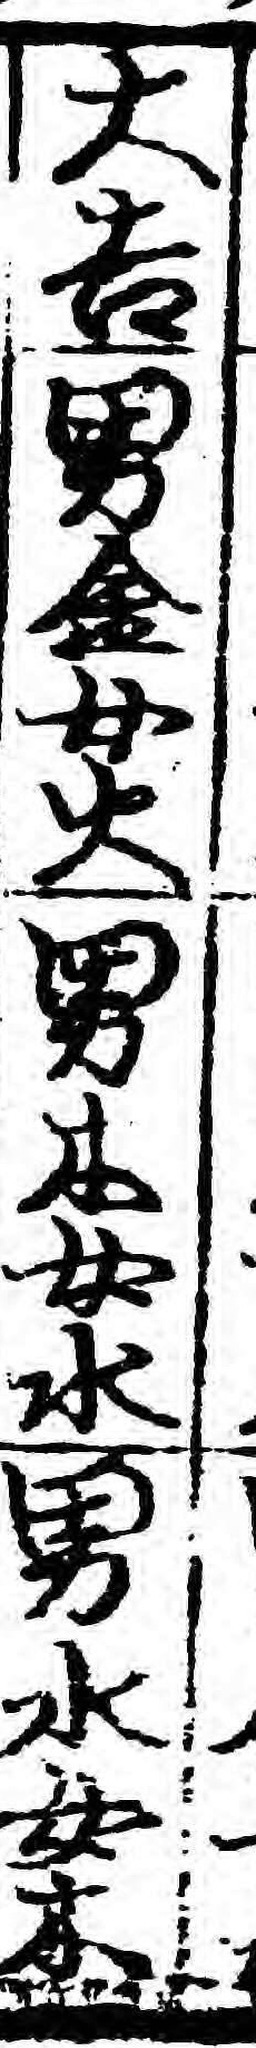大吉男金女火男木女水男水女木
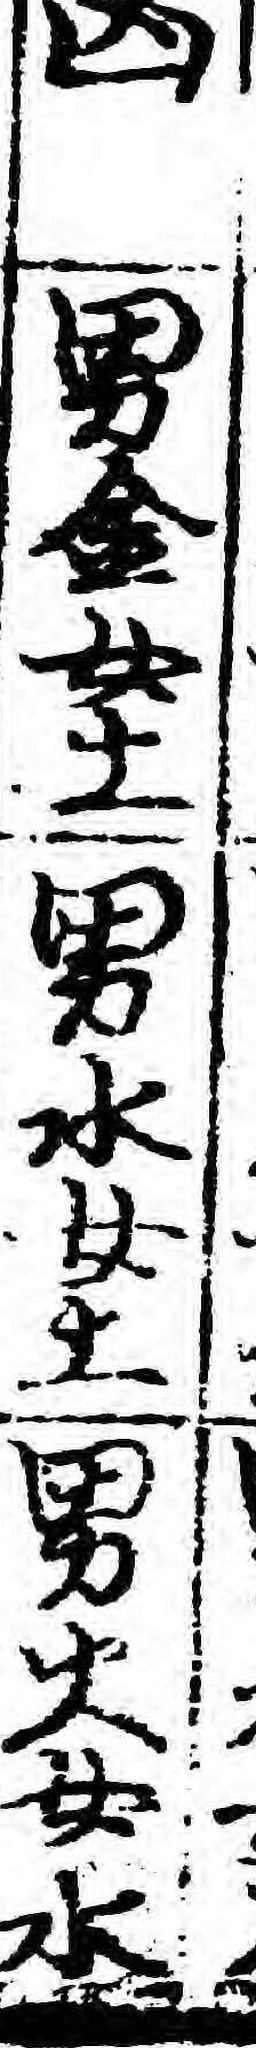凶男金女土男水女土男火女水
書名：頭書和歌注譯／壽賀多百人一首小倉錦
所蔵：国文学研究資料館
